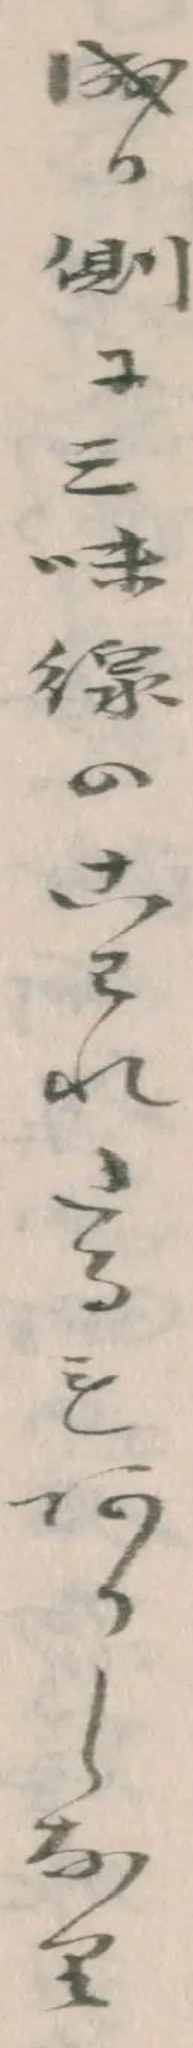成り側に三味線のこわれたるもありしなり
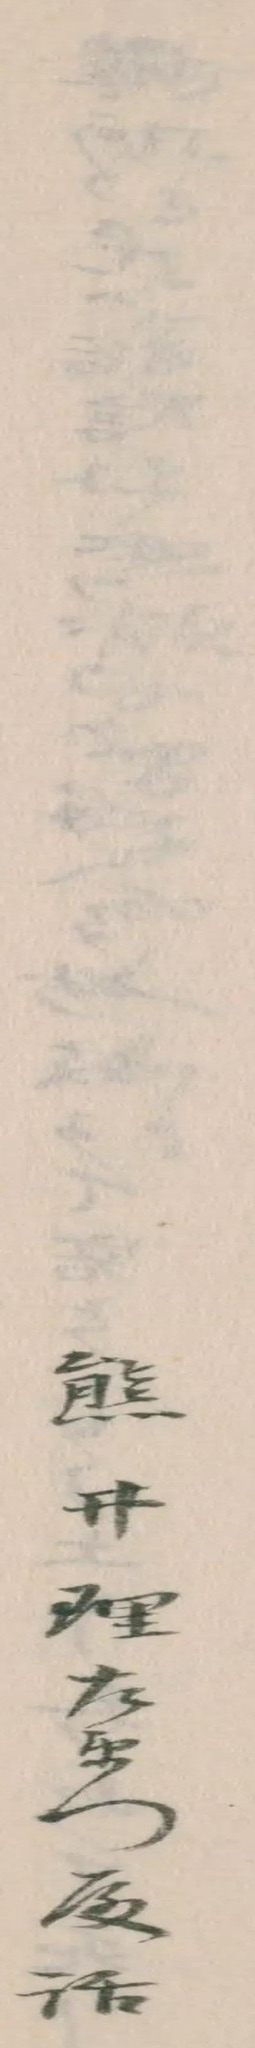熊井理左衛門殿話
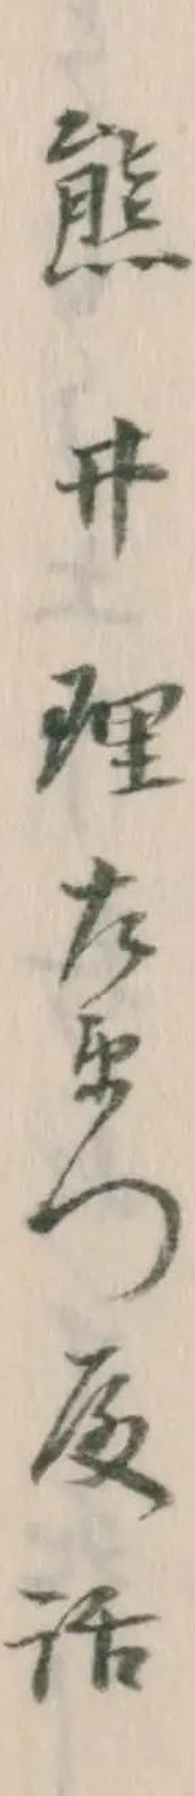熊井理左衛門殿話
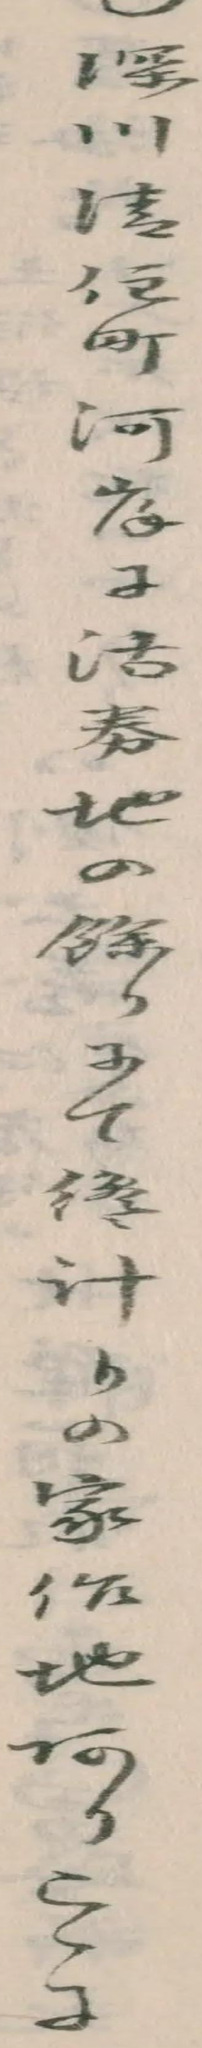〇深川清住町河岸に沽券地の余りにて纔計りの家作地ありこゝに
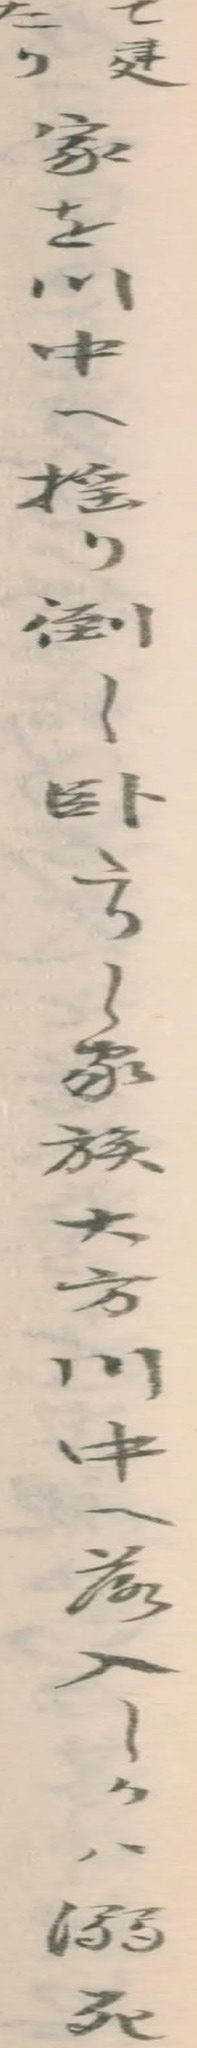て建たり家を川中へ揺り倒し臥たりし家族大方川中へ落入しかは溺死
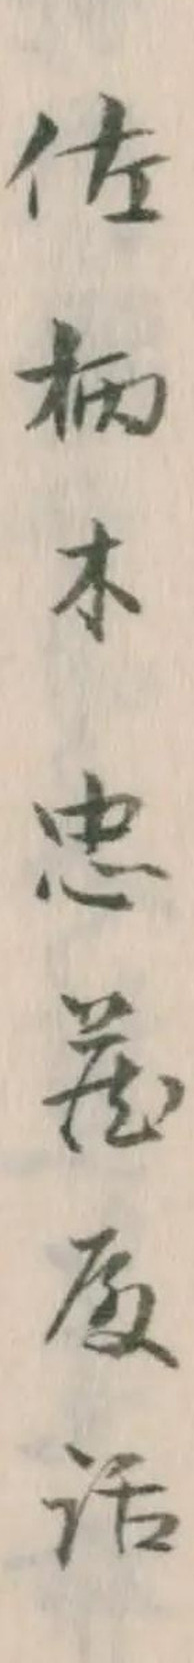佐柄木忠蔵殿話
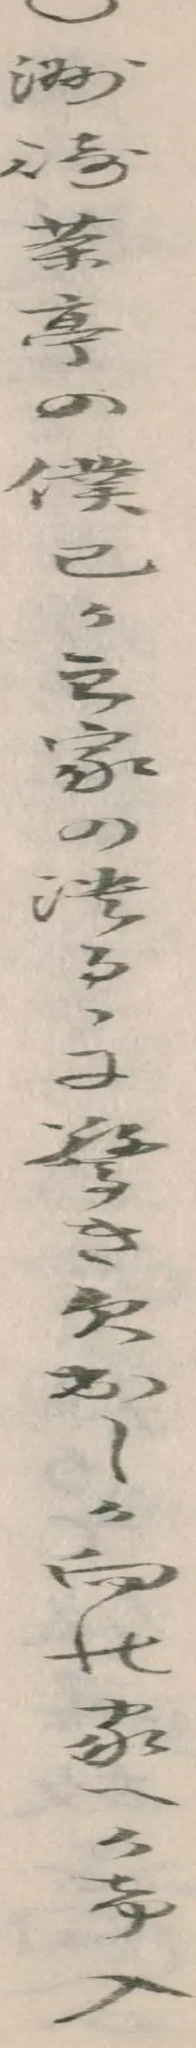〇洲崎茶亭の僕己か主家の潰るゝに驚き欠出しか向の家へかけ入
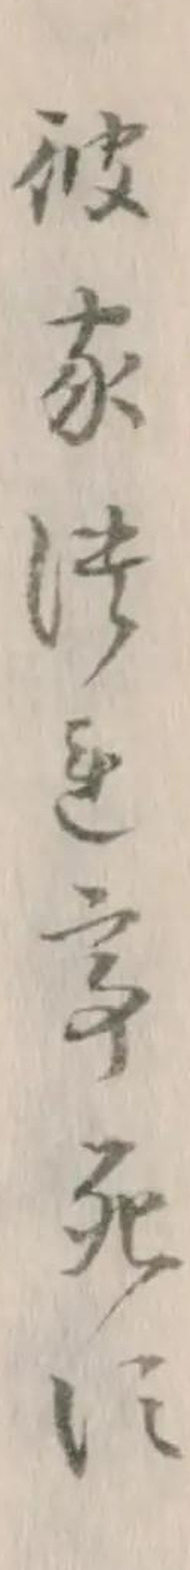彼家潰れて死す
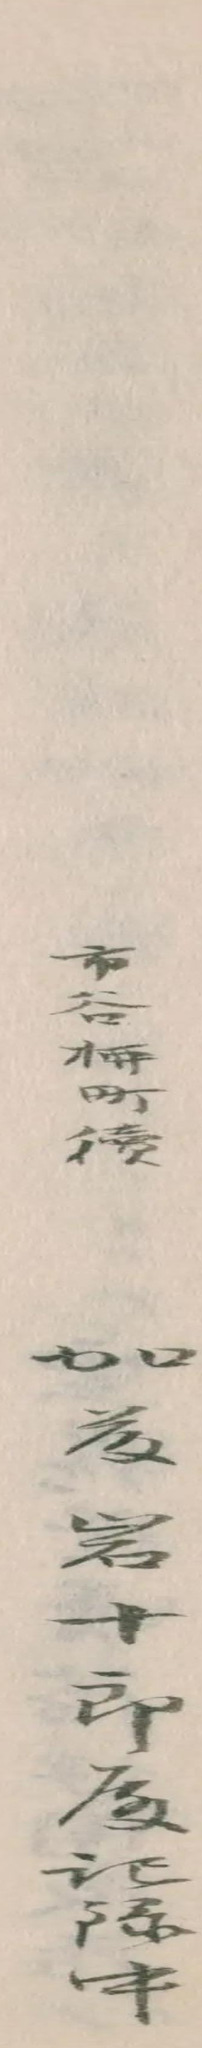市谷柳町続加藤岩十郎殿記録中
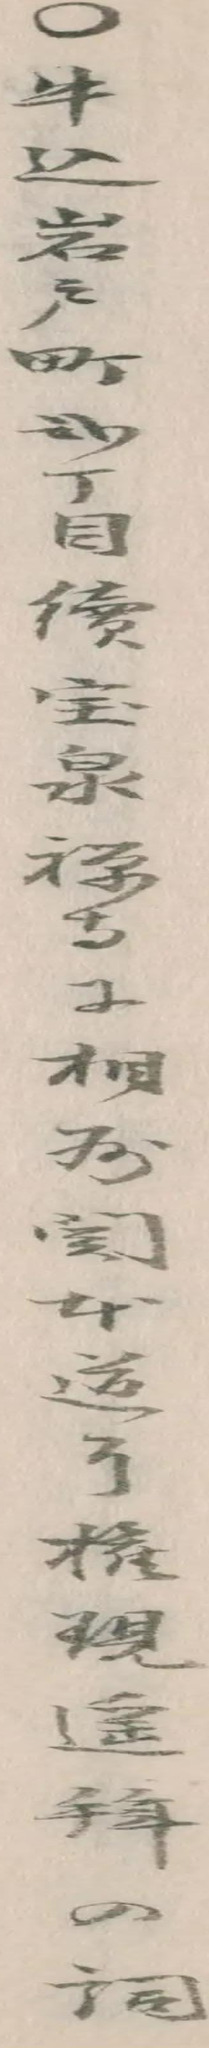〇牛込岩戸町弐丁目続宝泉禅寺に相州関本道了権現遥拝の詞
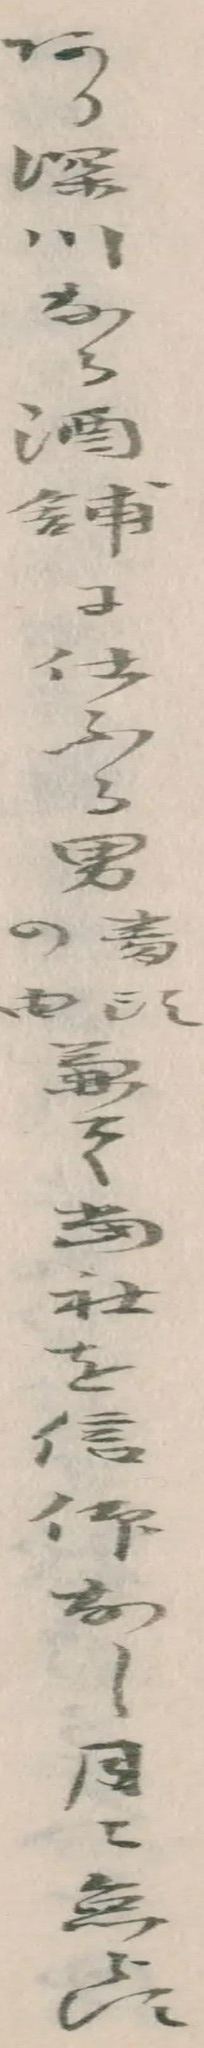あり深川なる酒舗に仕ふる男番頭の由兼て当社を信仰なし月に怠らす
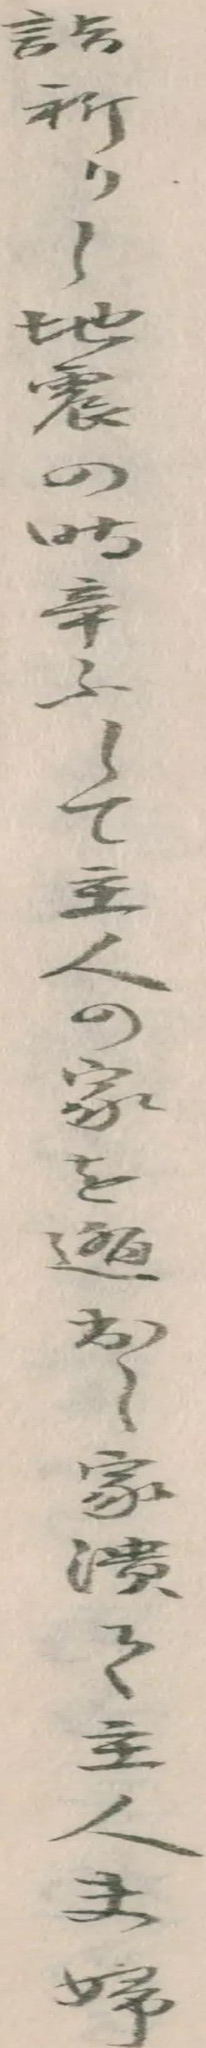詣祈りし地震の時辛ふして主人の家を遁出し家潰て主人夫婦
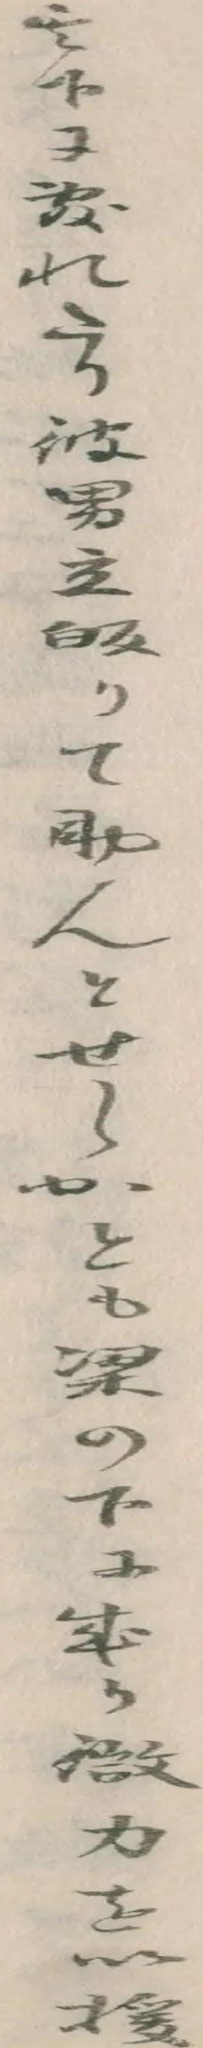其下に敷れたり彼男立帰りて助んとせしかとも梁の下に来り微力を以援

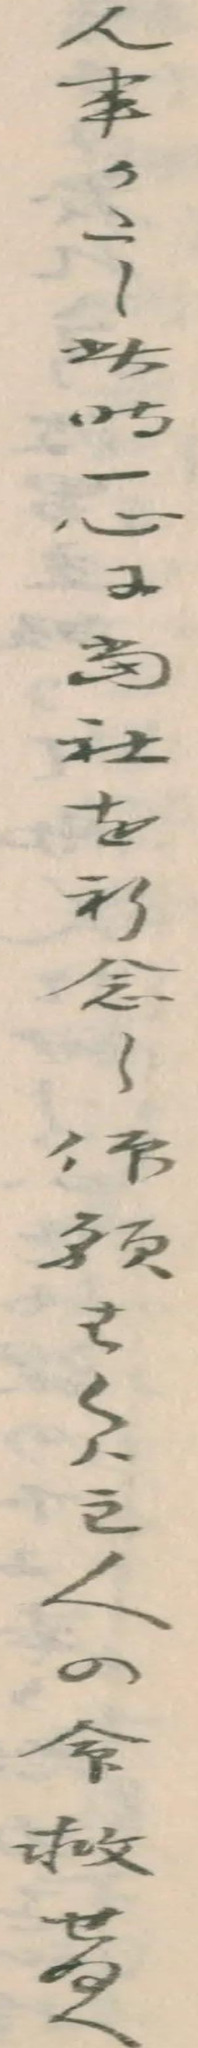ん事かたし此時一心に当社を祈念し仰願はくは主人の命救せ給へ
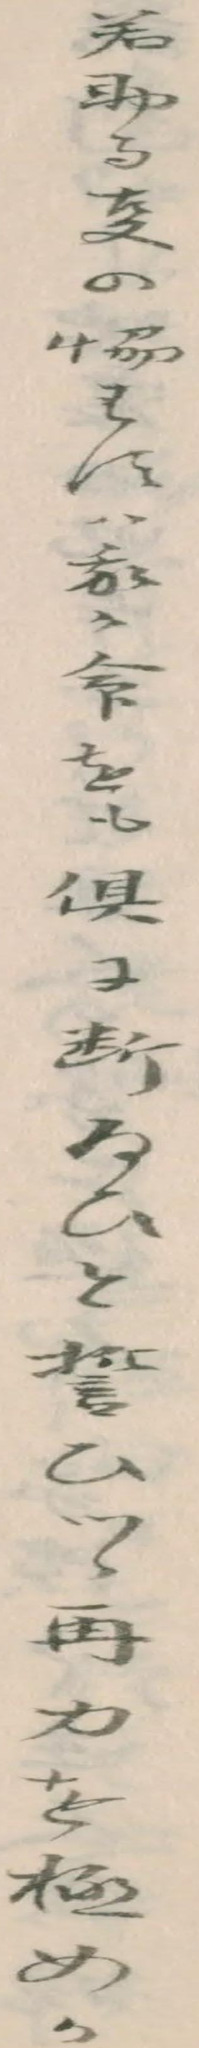若助る事の協はすは我が命をも俱に断給ひと誓ひつゝ再力を極めか
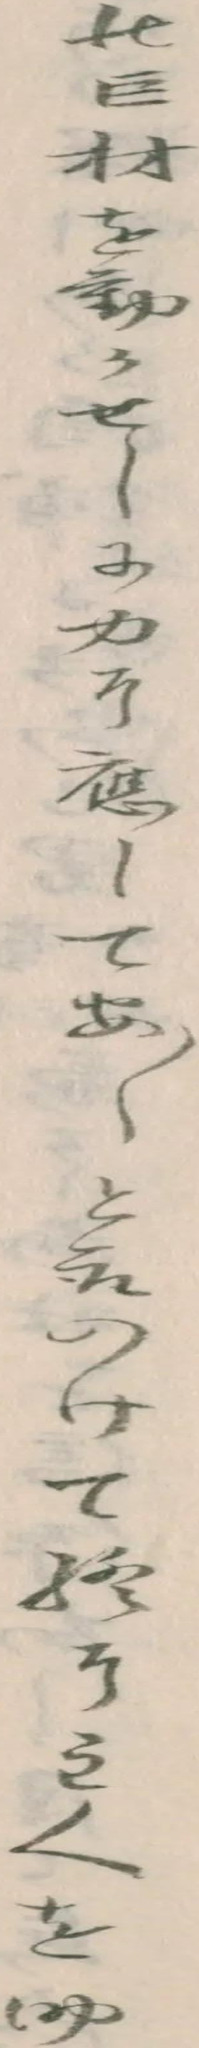の巨材を動かせしに力に応して安〳〵と取のけて終に主人を助
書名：地災撮要. 巻7-9(地震之部)
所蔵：国立国会図書館 National Diet Library, JAPAN
